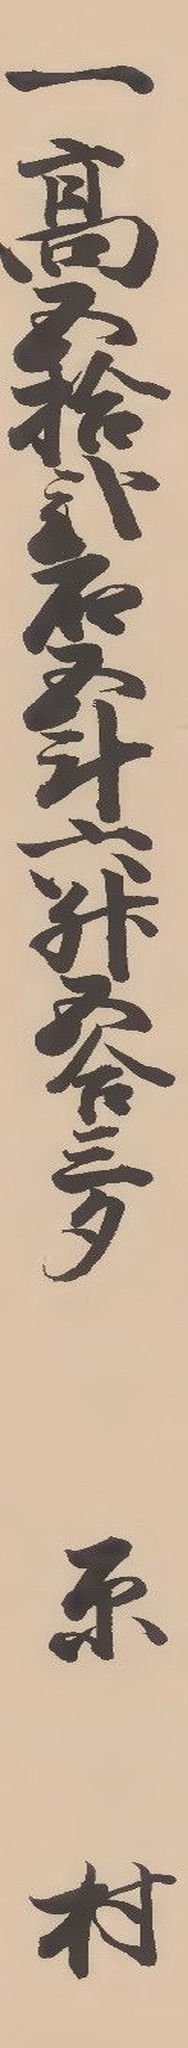一高五拾弐石五斗六升五合三勺原村
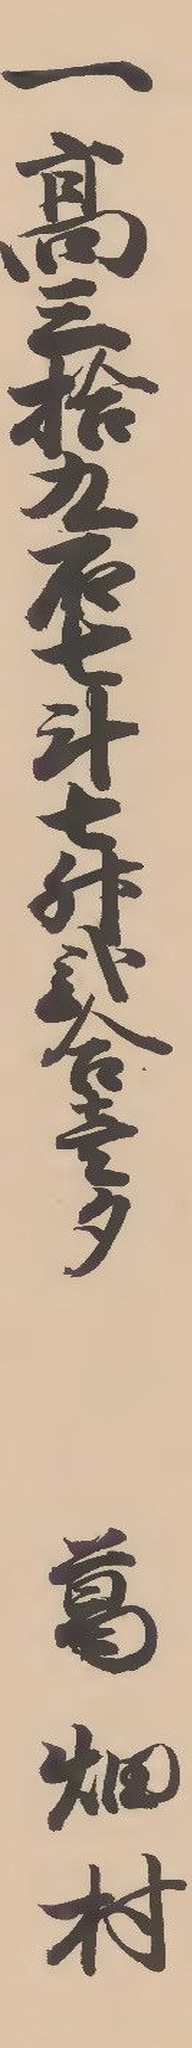一高三拾九石七斗七升弐合壱勺葛畑村

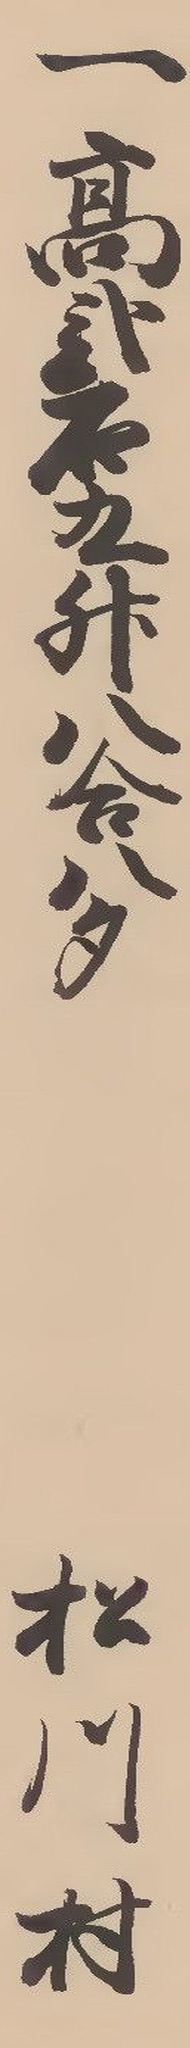一高弐石九升八合八勺松川村
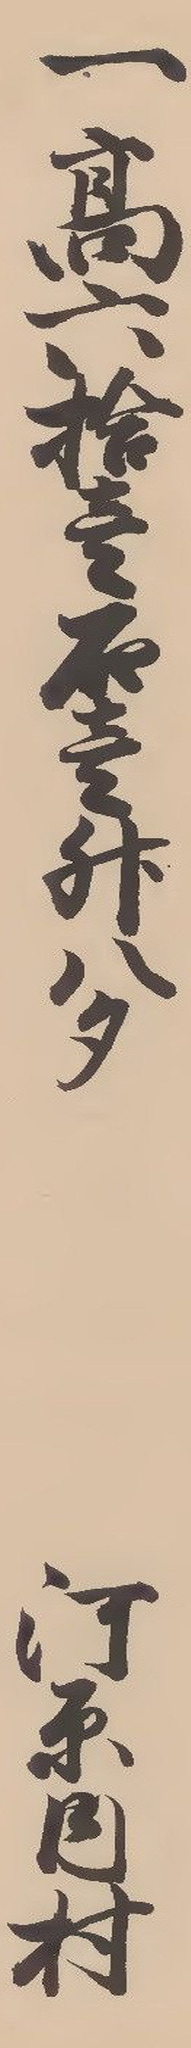一高六拾壱石壱升八勺河原内村
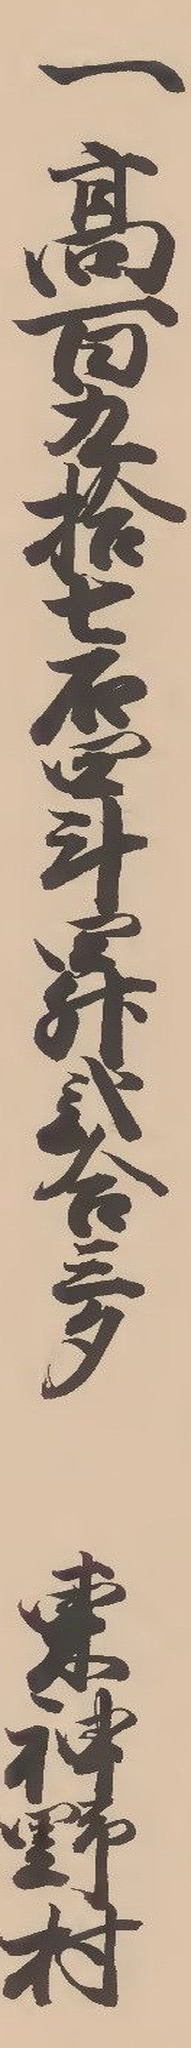一高百九拾七石四斗四升弐合三勺東神野村
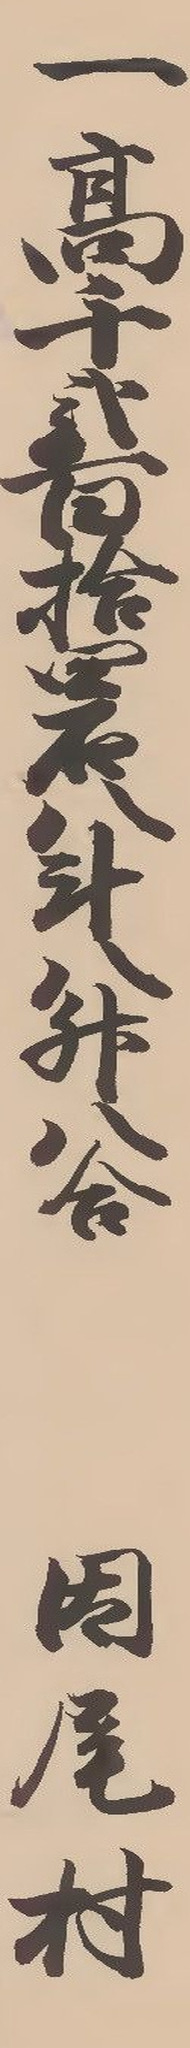一高千弐百拾四石八斗八升八合因尾村
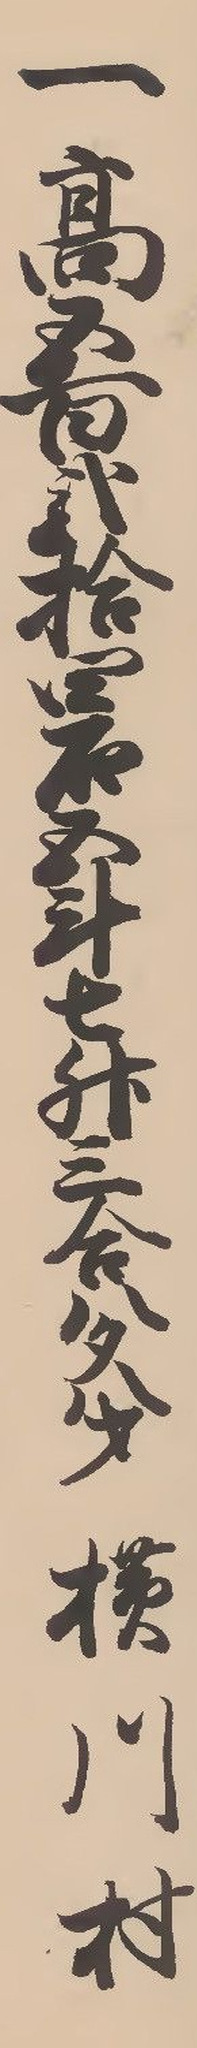一高五百弐拾四石五斗七升三合八勺八才横川村
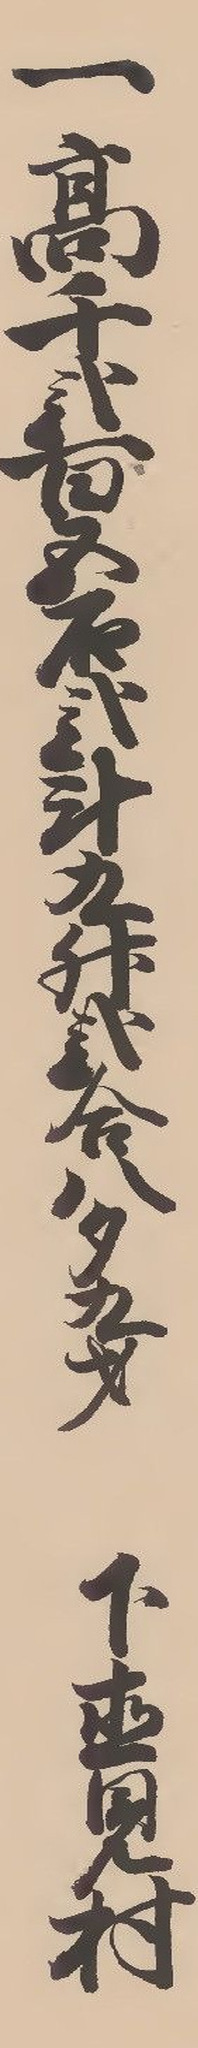一高千弐百五石弐斗九升弐合八勺九才下直見村
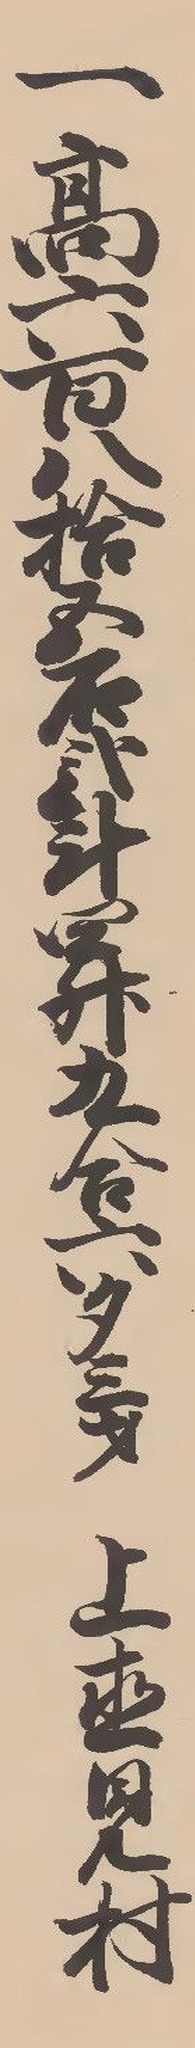一高六百八拾五石弐斗四升九合六勺三才上直見村
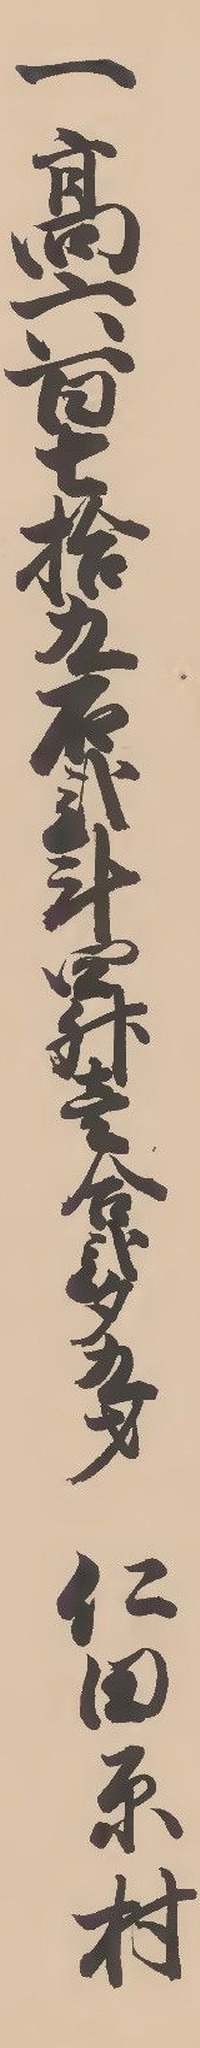一高六百七拾九石弐斗四升壱合弐勺九才仁田原村

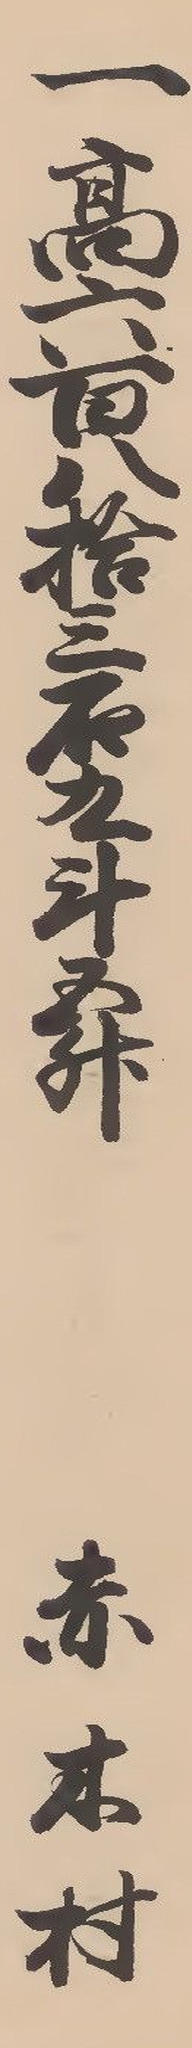一高六百八拾三石九斗五升赤木村
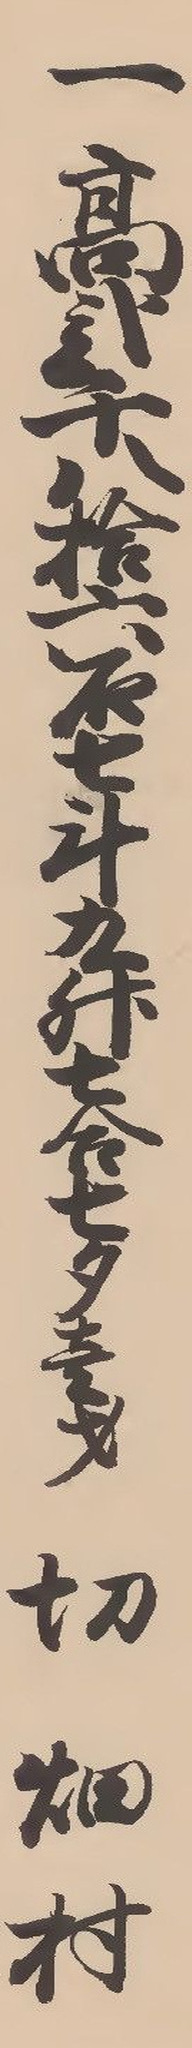一高弐千八拾六石七斗九升七合七勺壱才切畑村
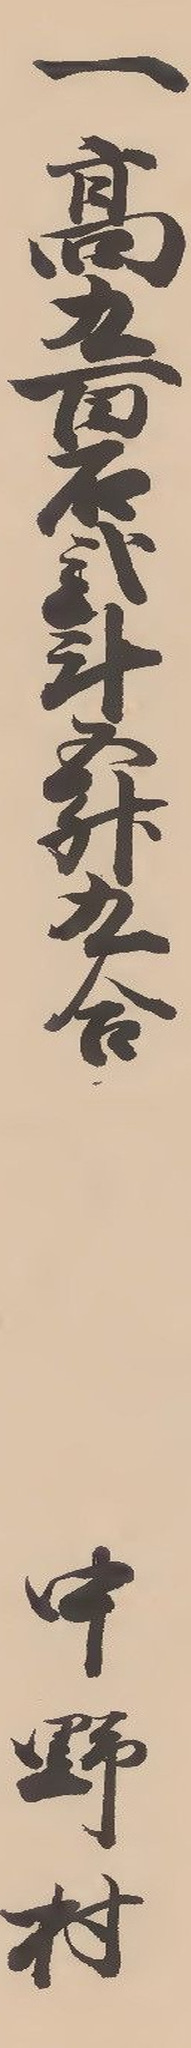一高九百石弐斗五升九合中野村
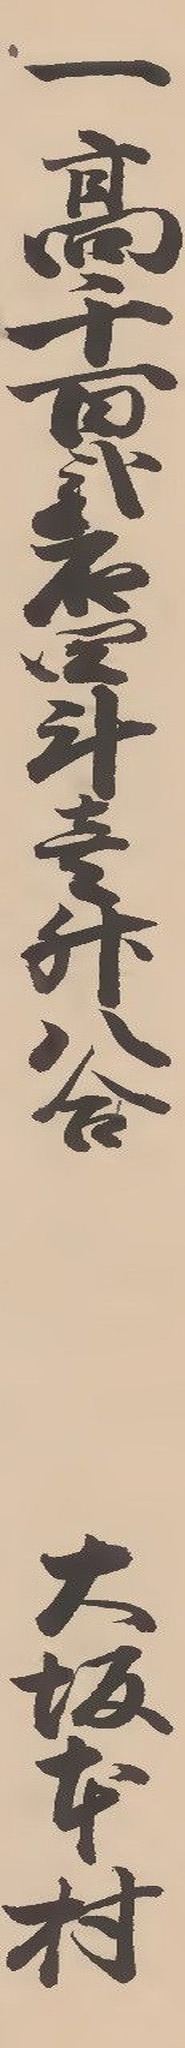一高千百弐石四斗壱升八合大坂本村
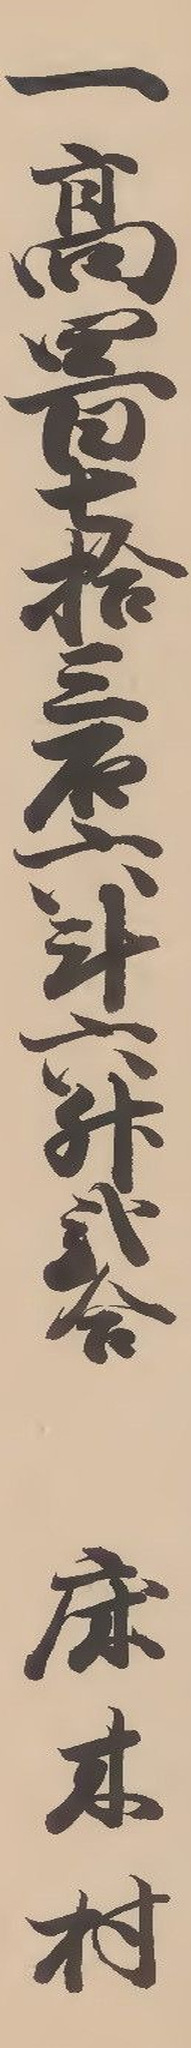一高四百七拾三石六斗六升弐合床木村
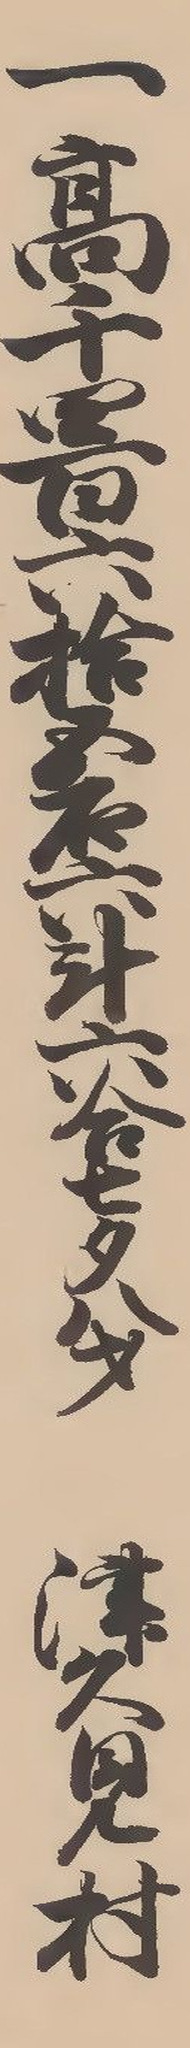一高千四百六拾五石六斗六合七勺八才津久見村
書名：豊後国郷帳
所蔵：国立公文書館 National Archives of Japan
